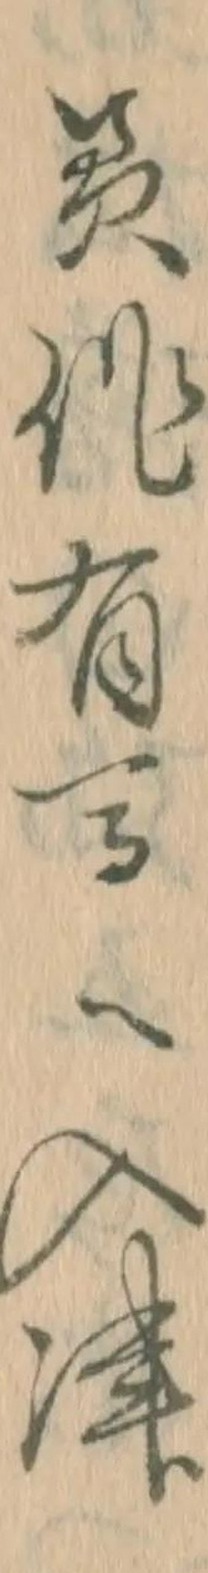美作有馬へ入津
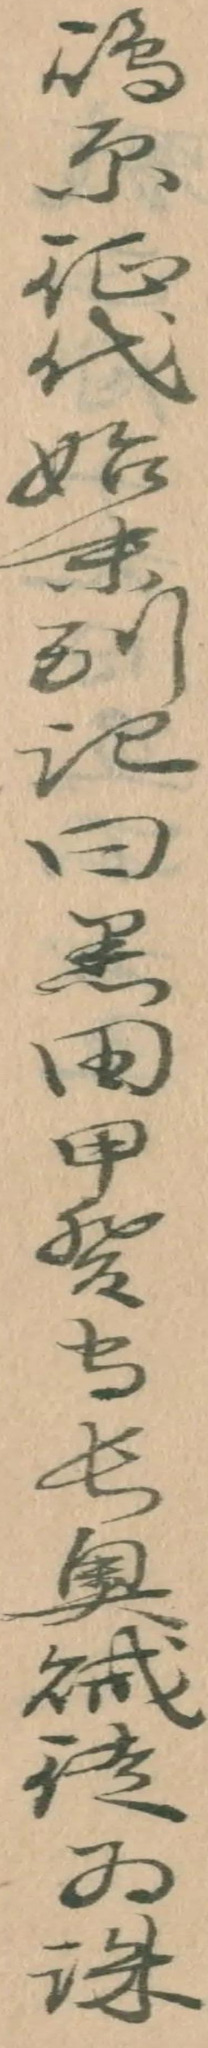島原征伐始末別記曰黒田甲斐守長奥賊徒ゐ誅

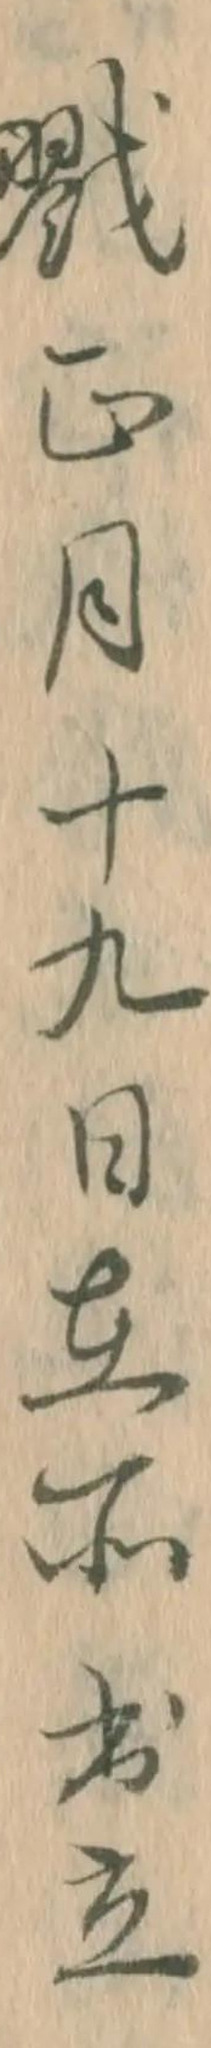戮正月十九日在所出立
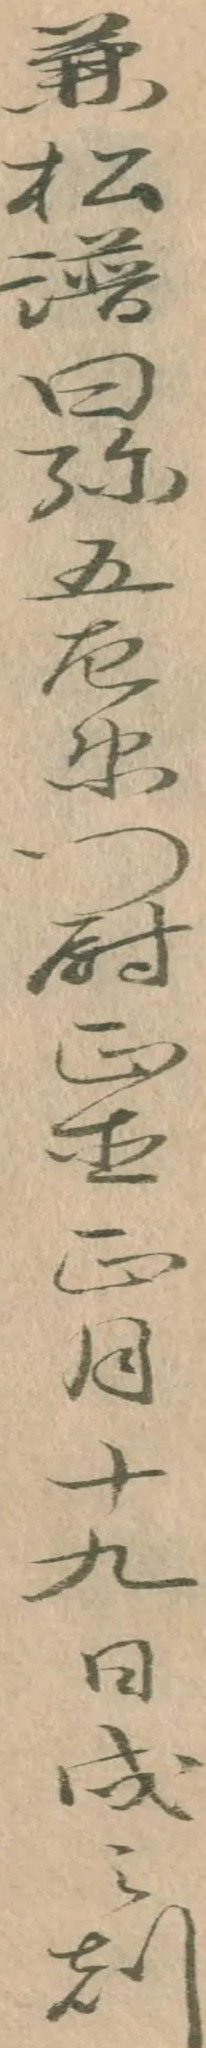兼松譜曰弥五左衛門尉正直正月十九日戌之刻
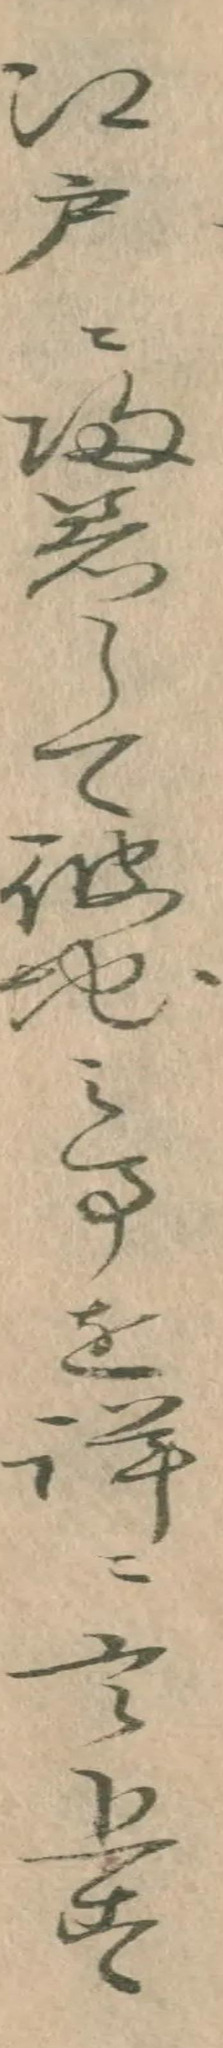江戸に帰着して彼地之事を詳に言上春
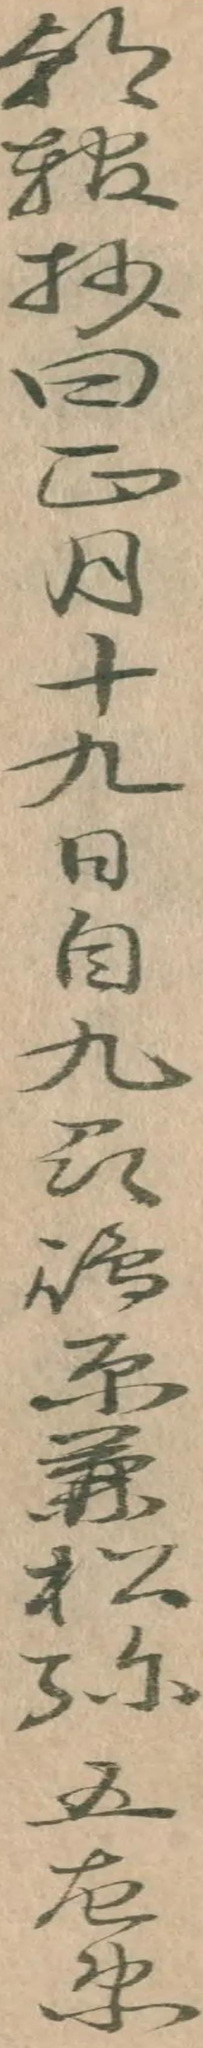朝報抄曰正月十九日自九州島原兼松弥五左衛
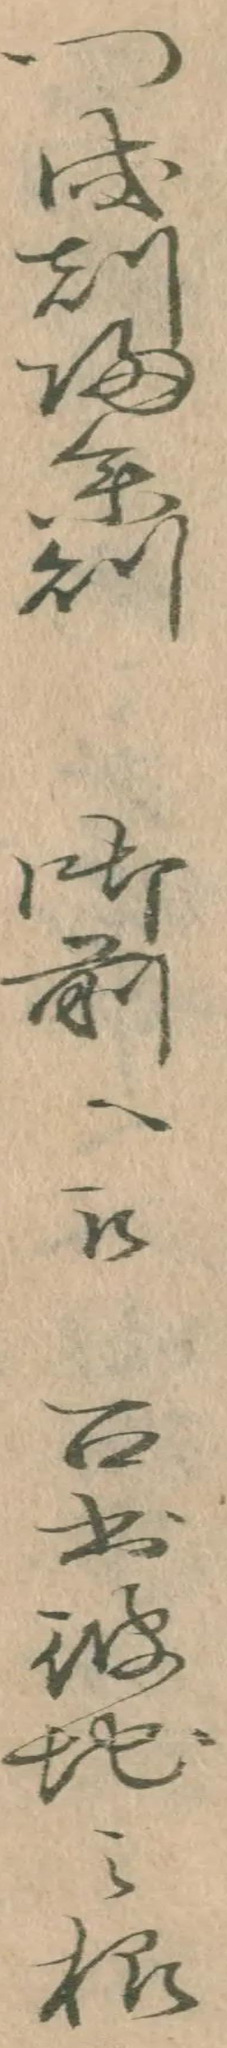門戌刻帰参則御前へ被召出彼地之様
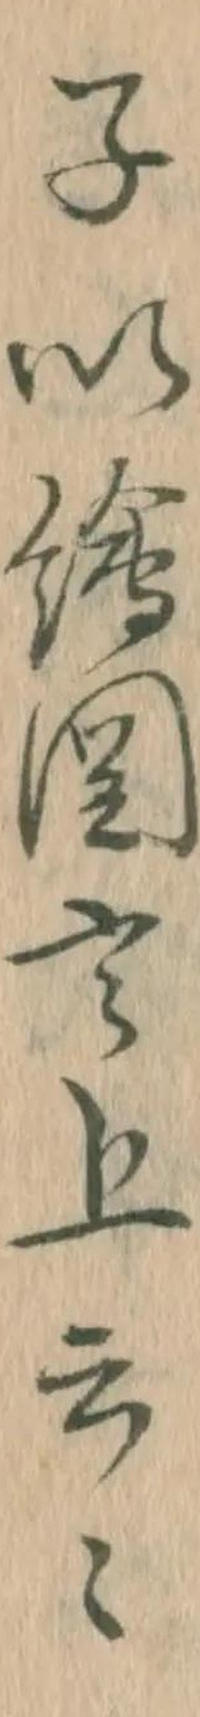子以絵図言上云々

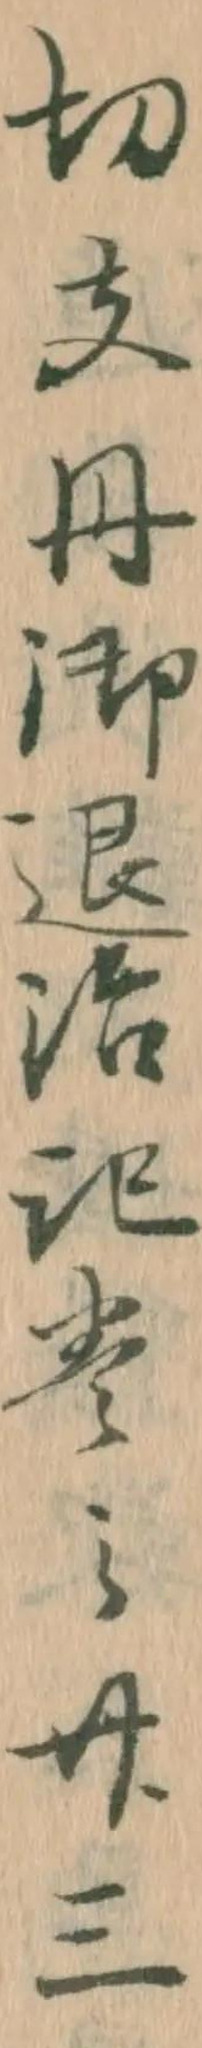切支丹御退治記巻之之廿三
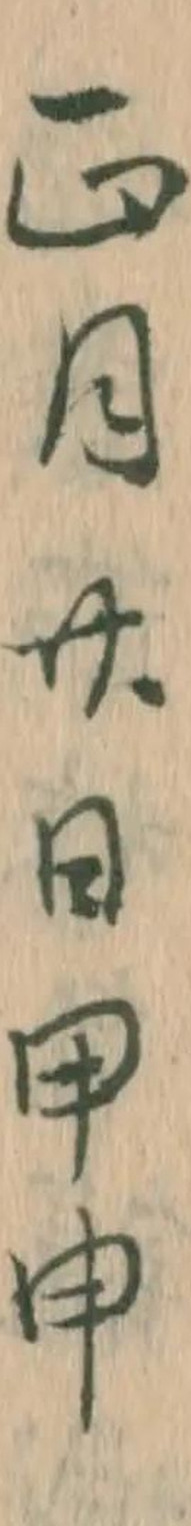正月廿日甲申
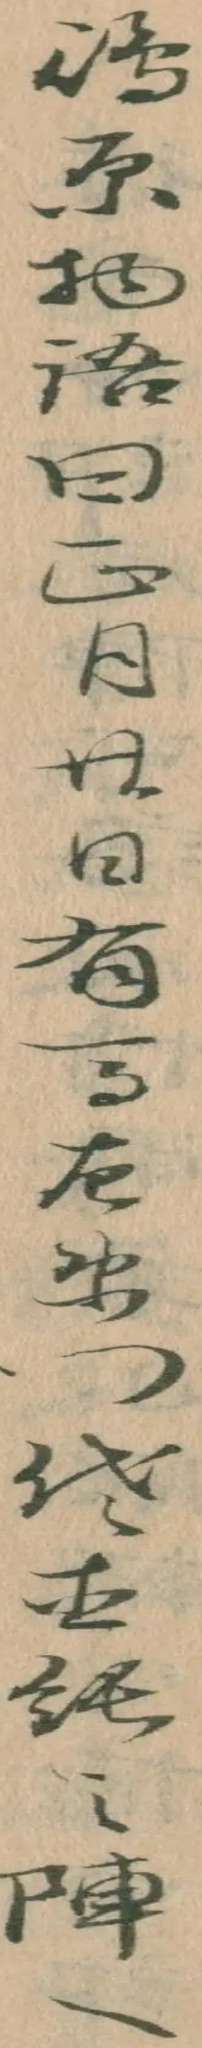島原物語曰正月廿日有馬左衛門佐直純之陣へ
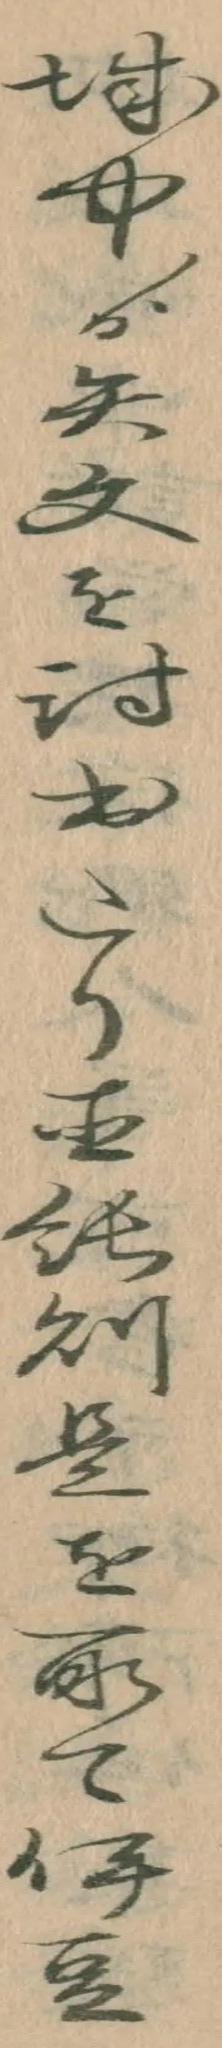城中ゟ矢文を討出たり直純則是を取て伊豆
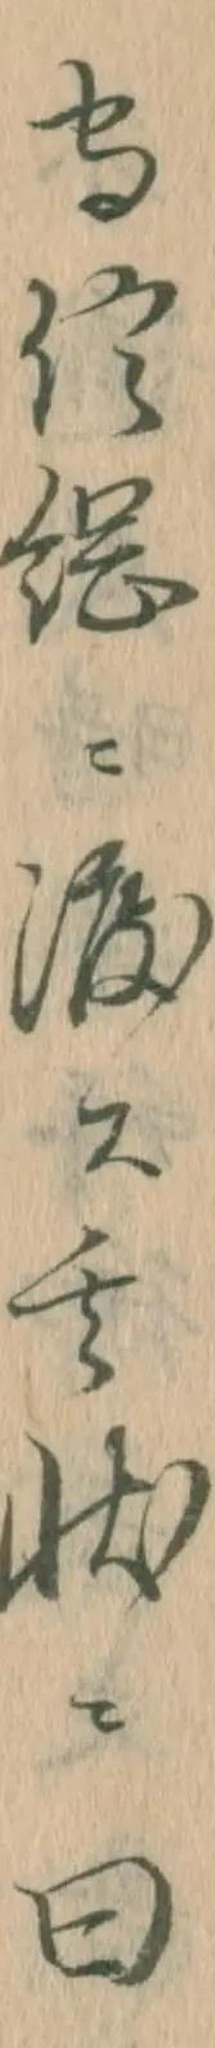守信綱に渡す其状に曰
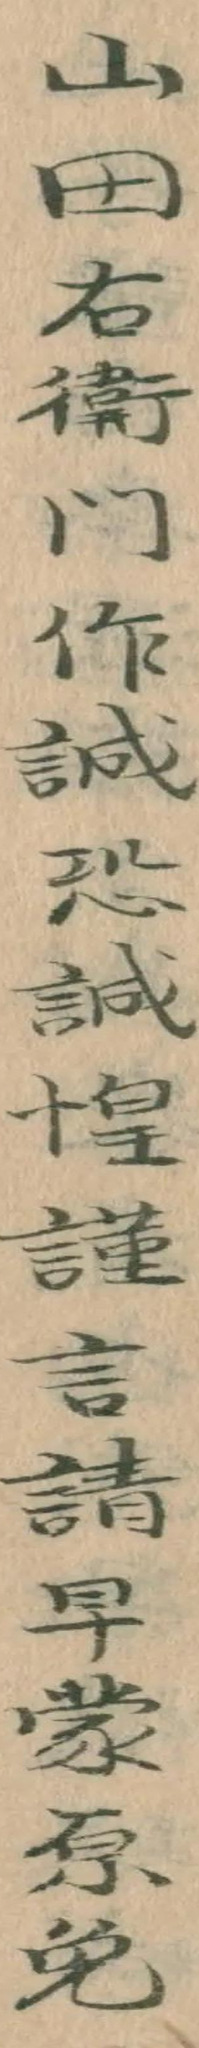山田右衛門作誠恐誠惶謹言請早蒙原免
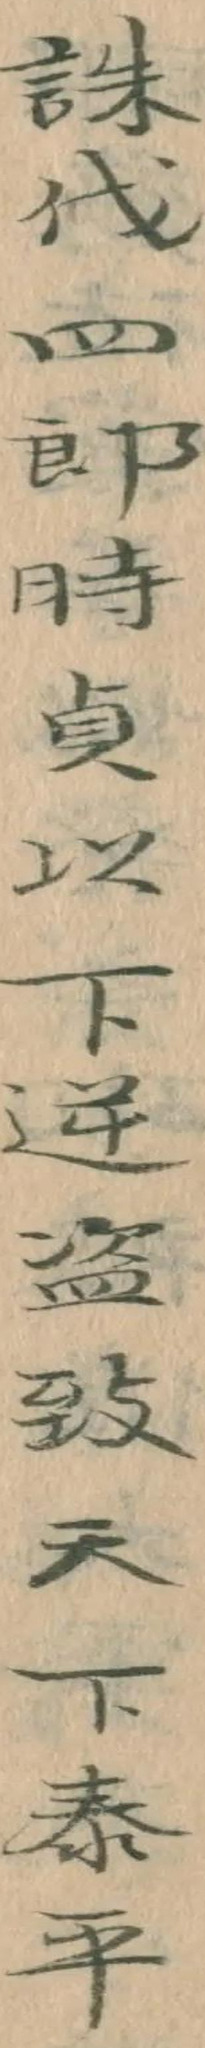誅伐四郎時貞以下逆盗致天下泰平
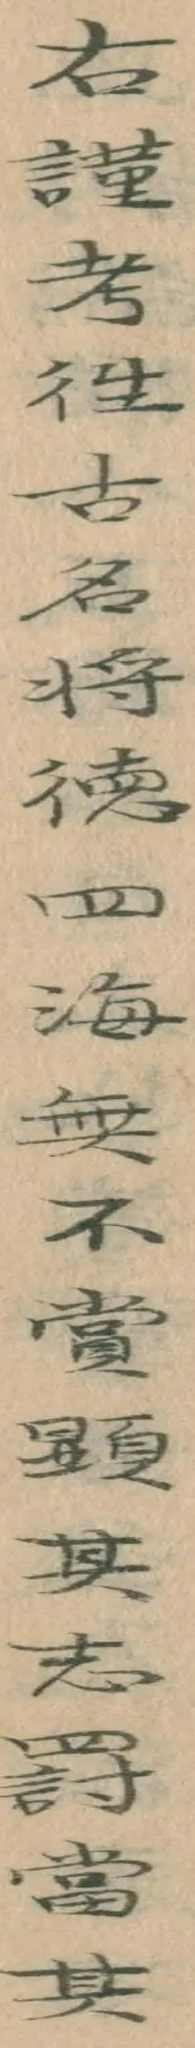右謹考往古名将徳四海無不賞顕其志罸当其
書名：切支丹御退治記 49巻. [6]
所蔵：国立国会図書館 National Diet Library, JAPAN
